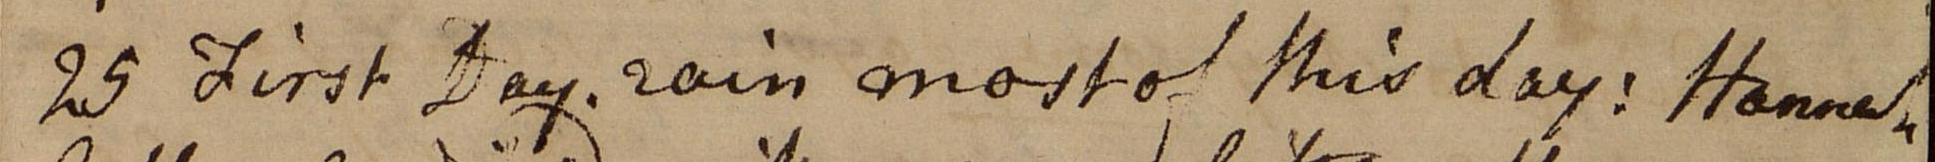25 First Day. rain most of this day: Hannah
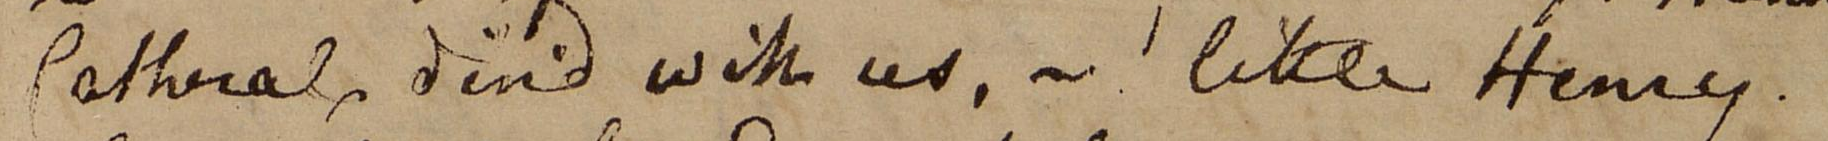Catheral din'd with us,- little Henry.
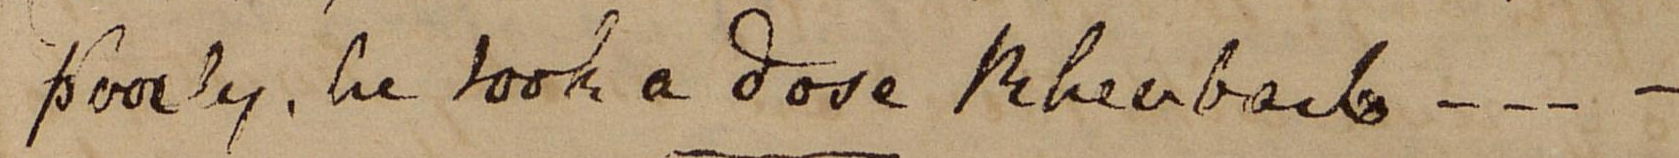poorly, he took a dose Rheubarb-
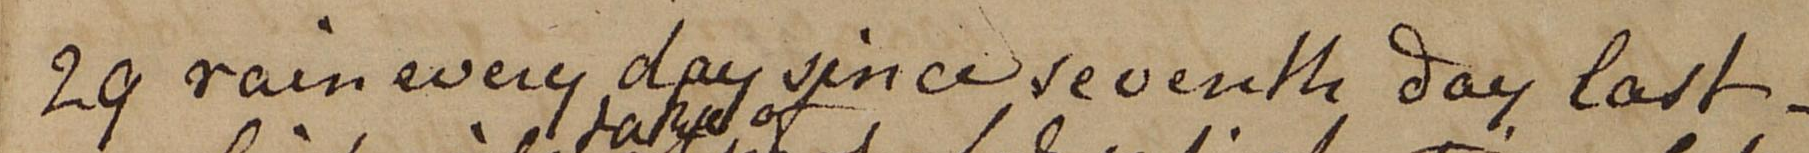29 rain every day since seventh day last-
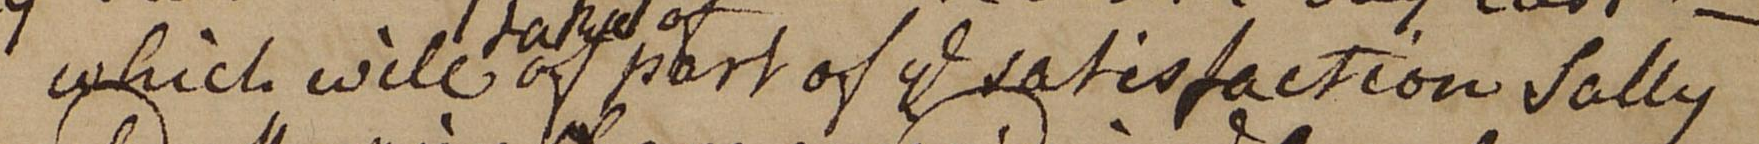which will of part of y^e satisfaction Sally
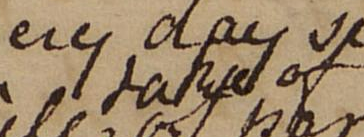take of
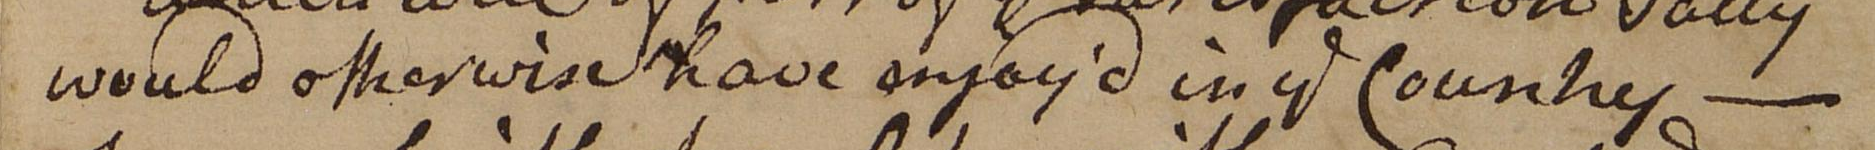would otherwise have enjoy'd in y^e Country-
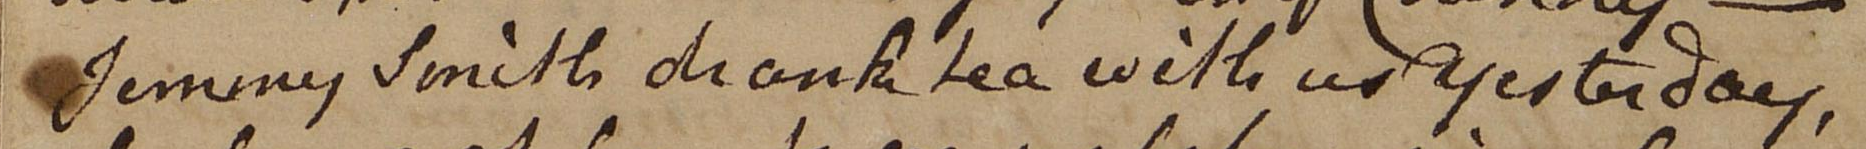Jemmy Smith drank tea with us yesterday,
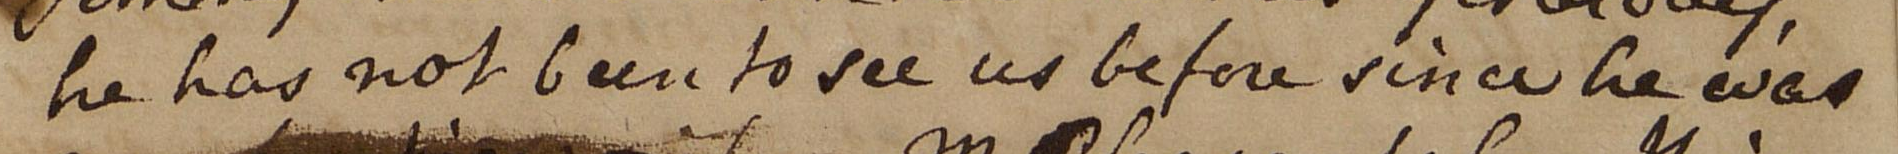he has not been to see us before since he was
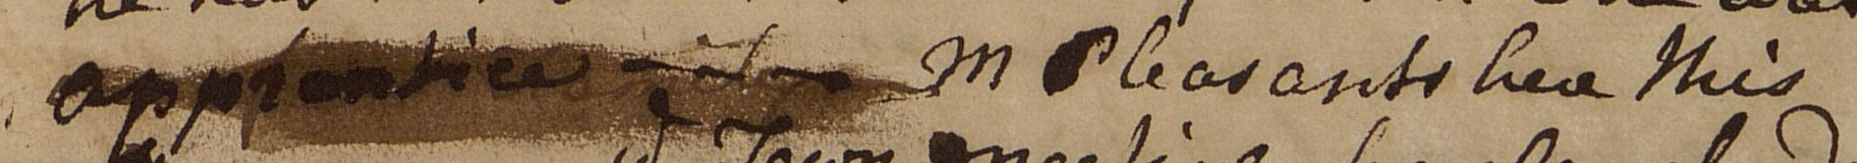apprentice---M Pleasants here this
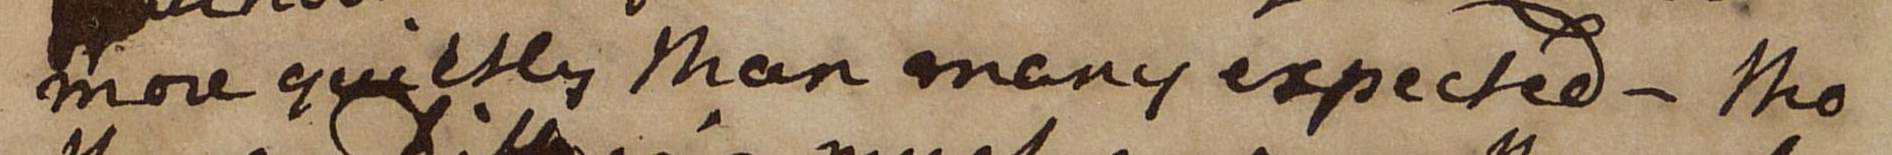more quietly than many expected- tho
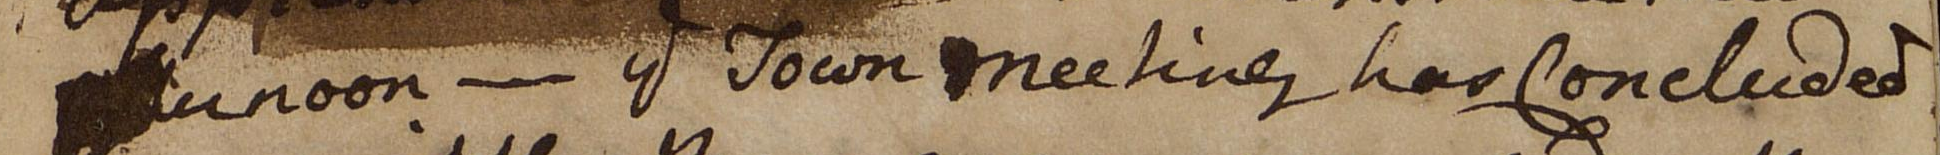afternoon- y^e Town meeting has Concluded
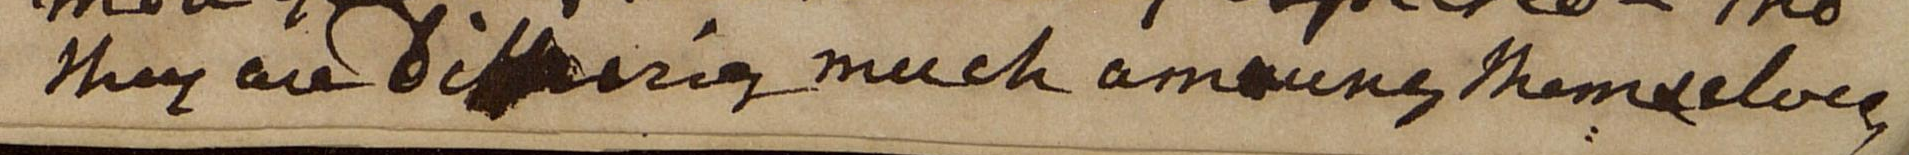they are di[__]ering much am[_]ung themselves
